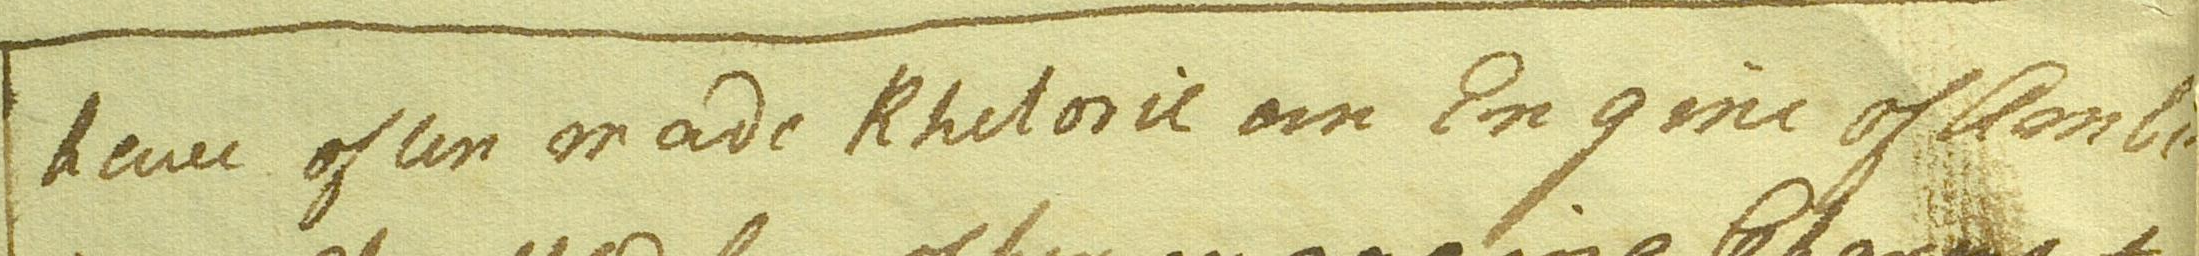have often made Rhetoric our Engine of Ambi-
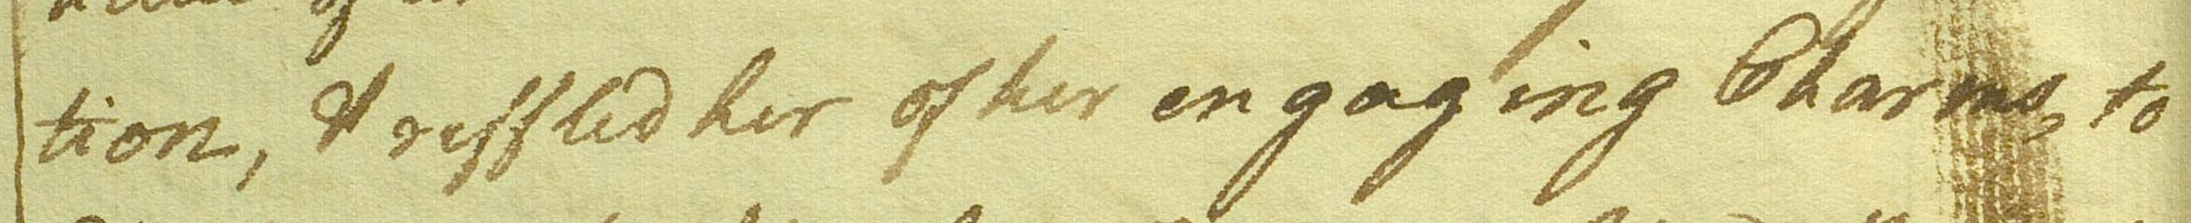-tion, & ruffled her of her engaging Charms, to
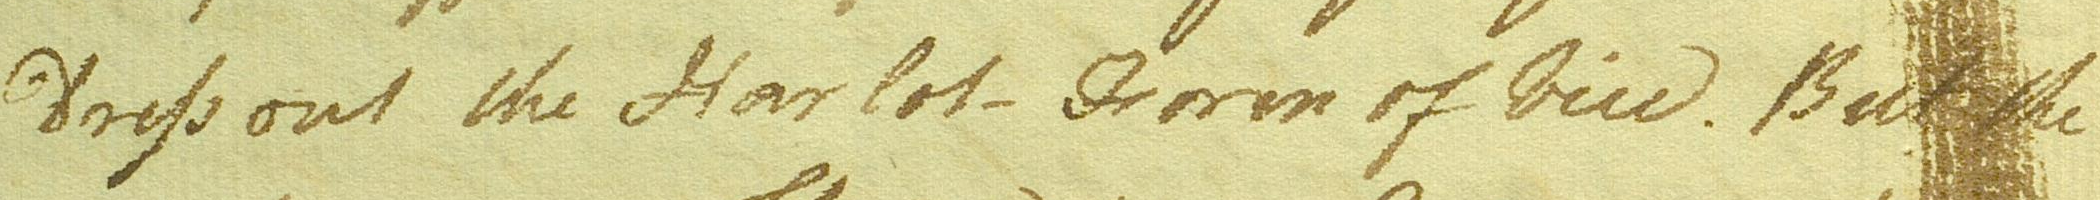dress out the Harlot Form of Vice. But the
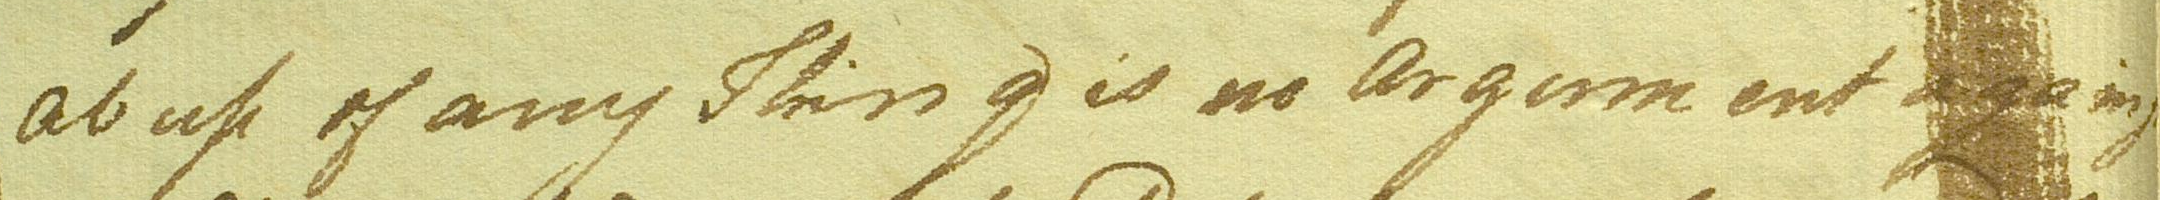abuse of any Thing is no argument against
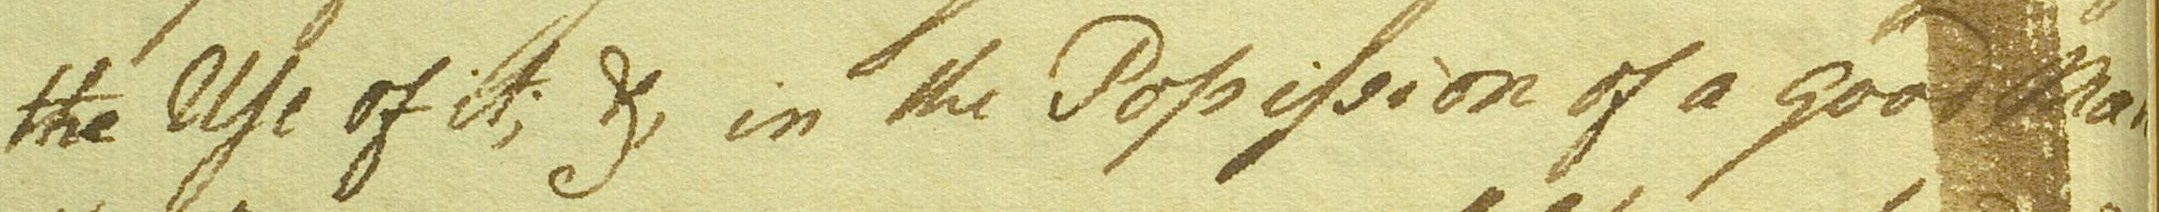the Use of it; & in the Possession of a good Man
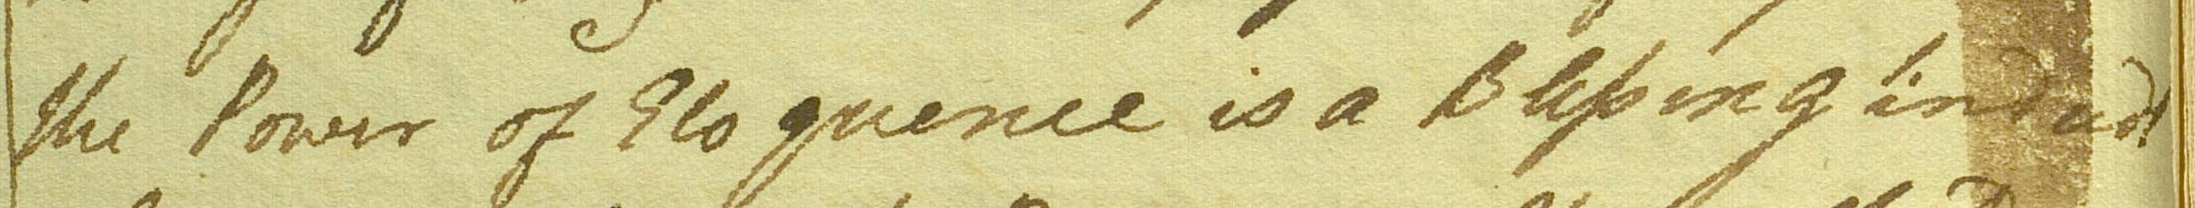the Power of Eloquence is a Blessing indeed
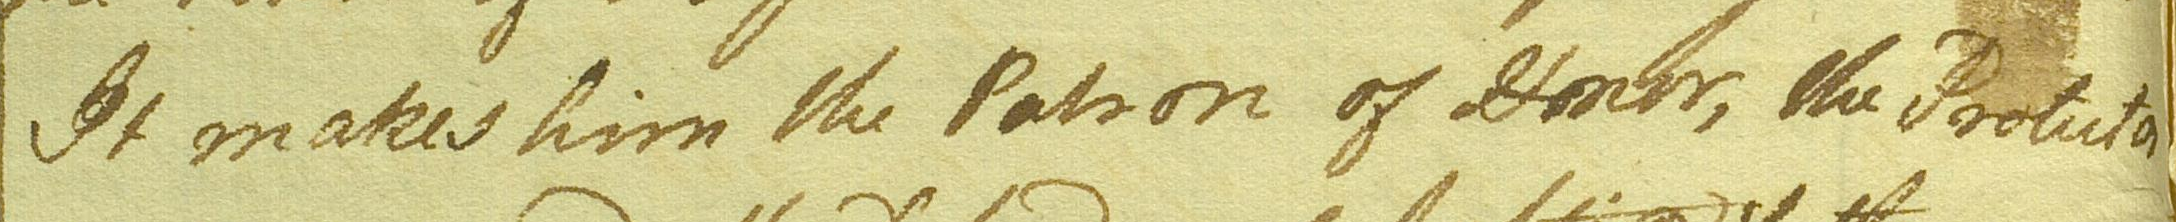It makes him the Person of Honor, the Protector
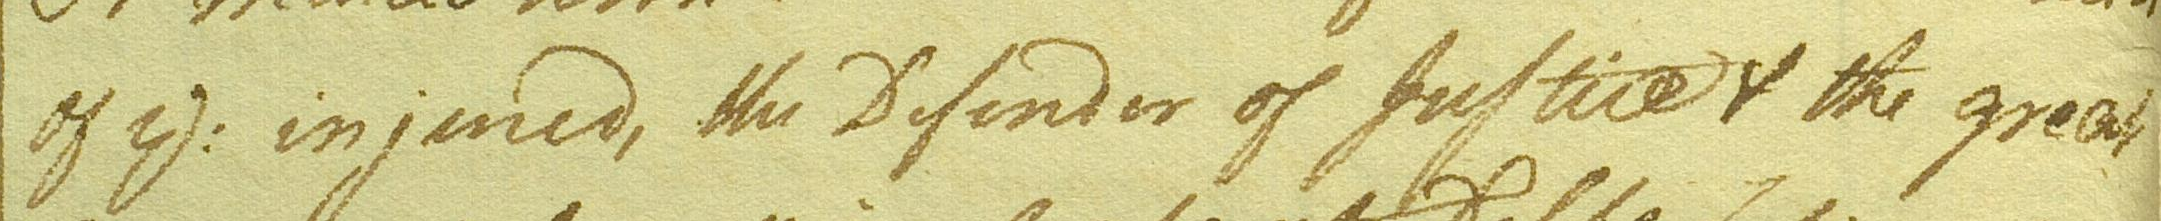of y^e injured, the Defender of Justice & the great
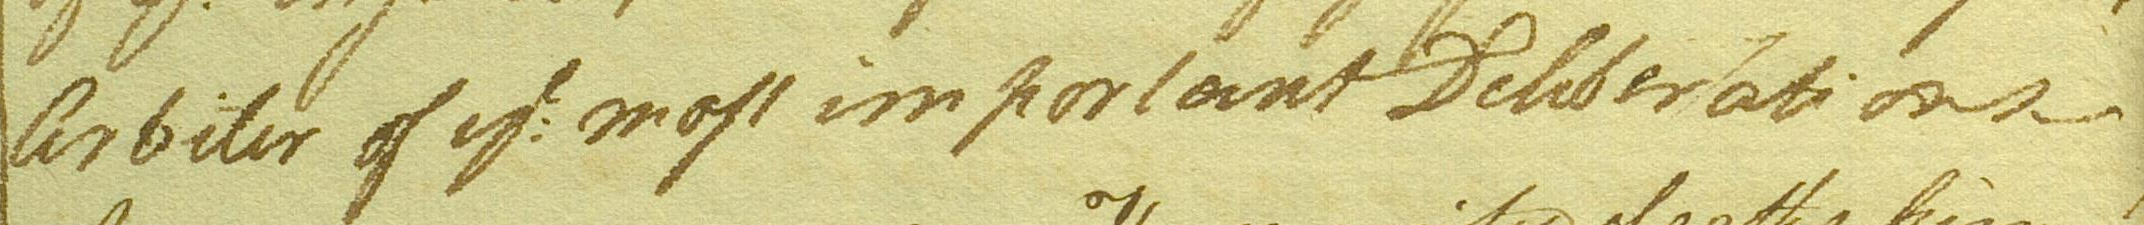Arbiter of y^e most important Deliberations.
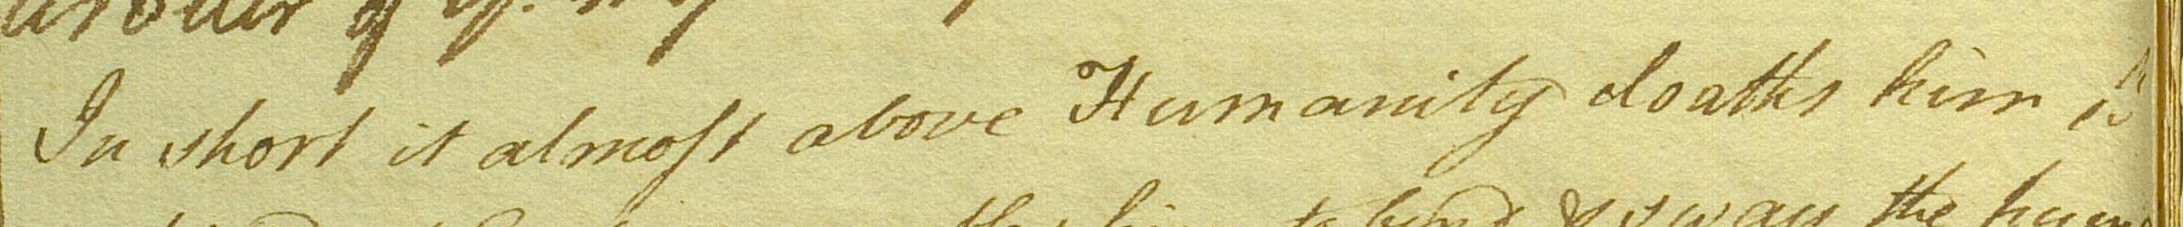In short it almost above Humanity cloathes him in
